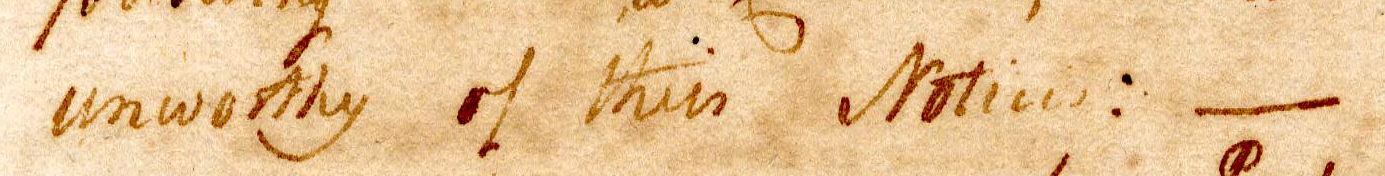unworthy of their Notices.
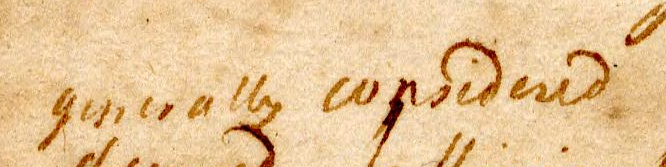generally considered
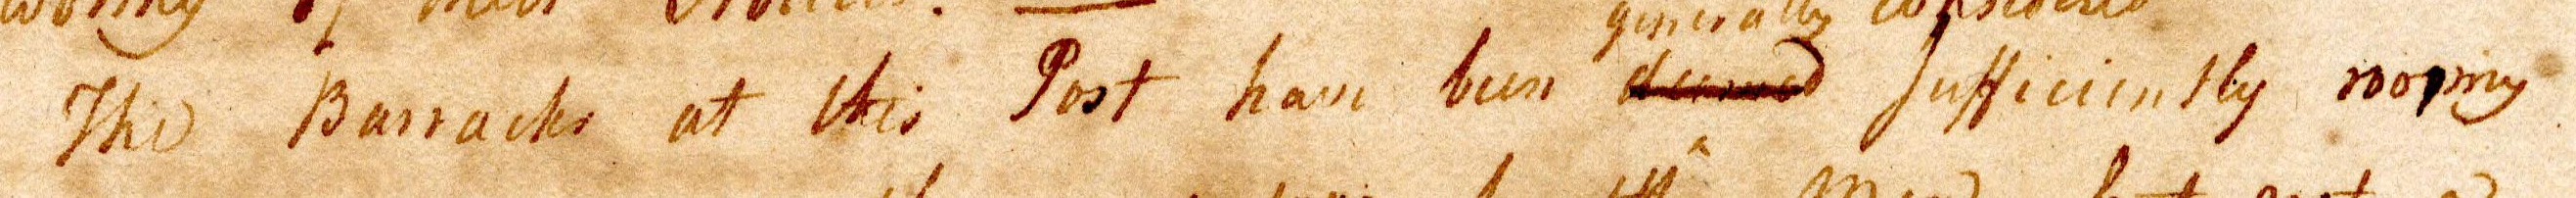The Barracks at this Post have been deemed ^ Sufficiently roomy
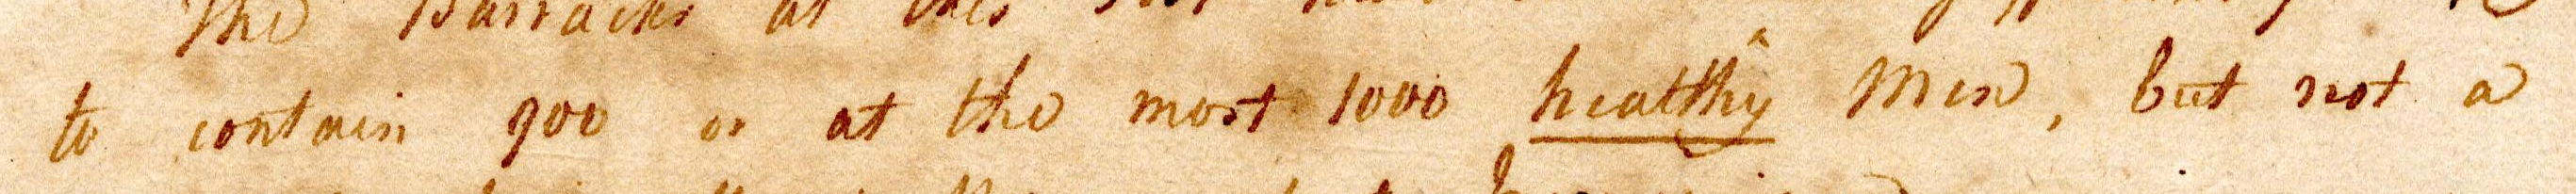to contain 900 or at the most 1000 healthy Men, but not a
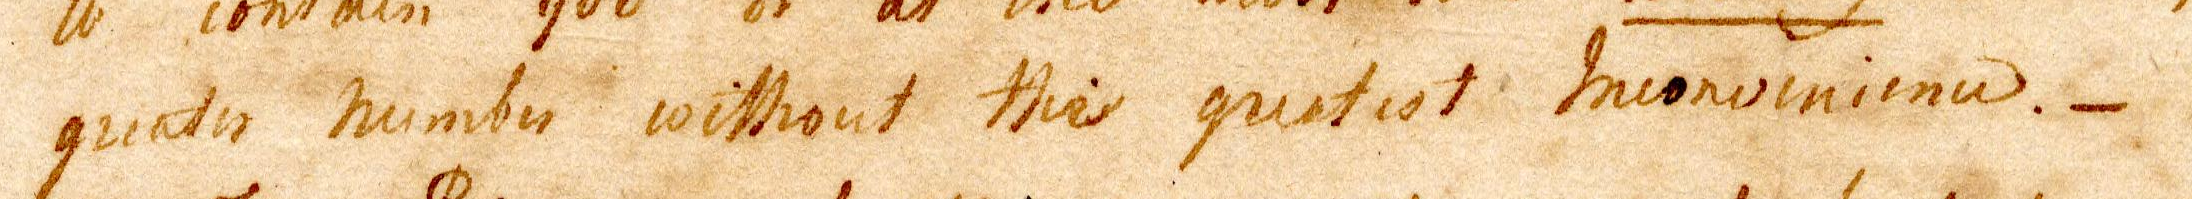greater number without this greatest Inconvenience.
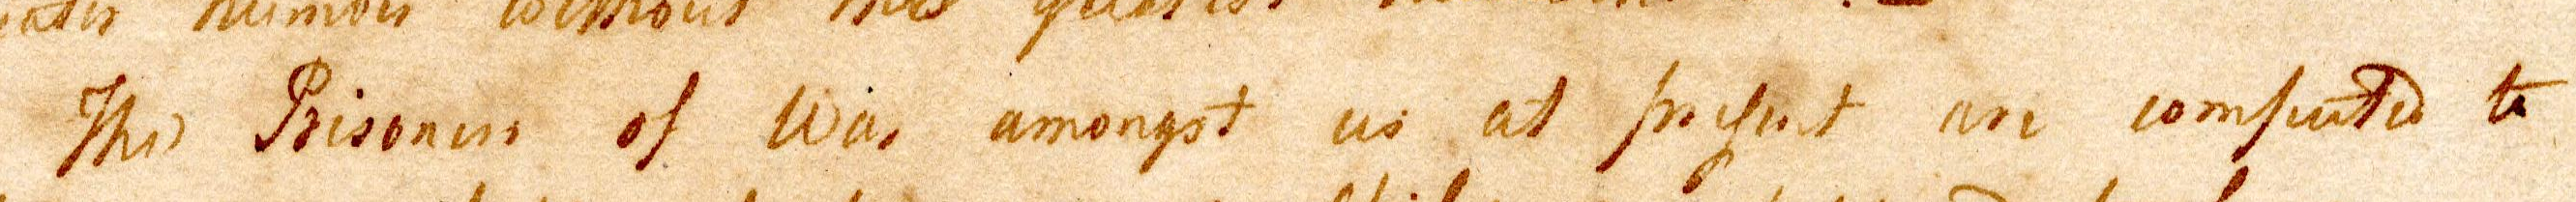The Prisoners of War amongst us at present are computed to
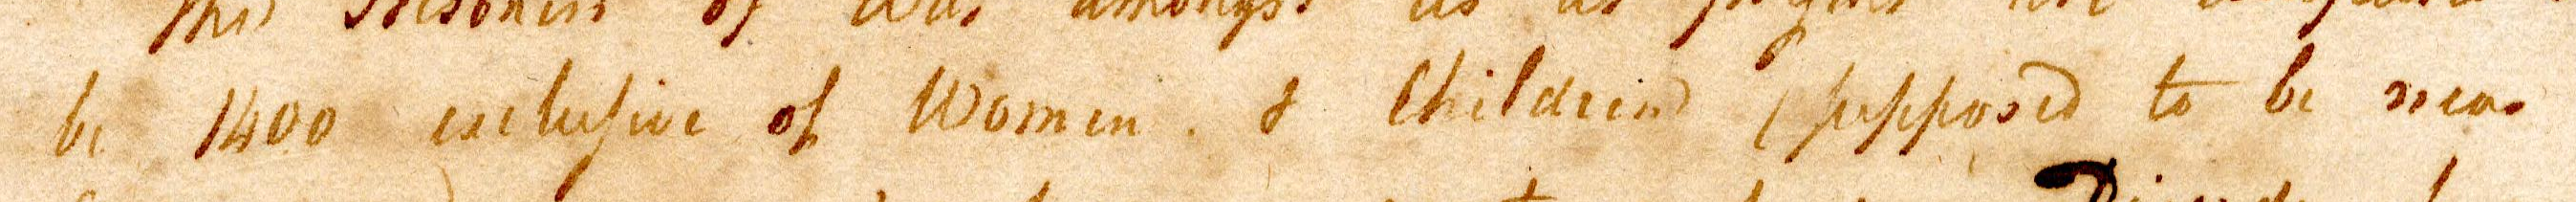be 1400 exclusive of Women & children (supposed to be near
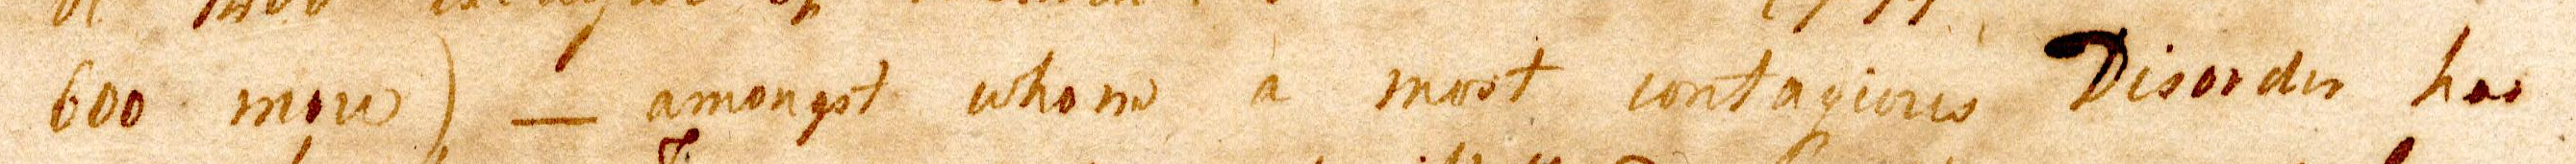600 more) amongst whom a most contagious Disorder has
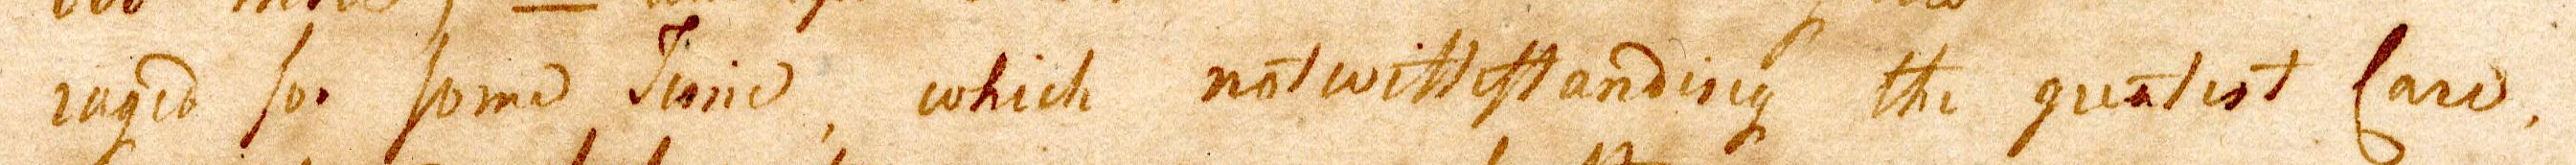raged for some Time, which not withstanding the greatest Care
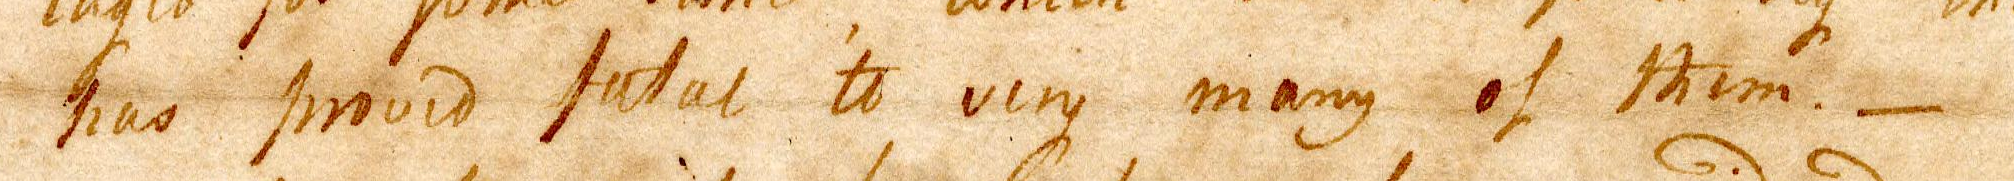has proved fatal to very many of them.
